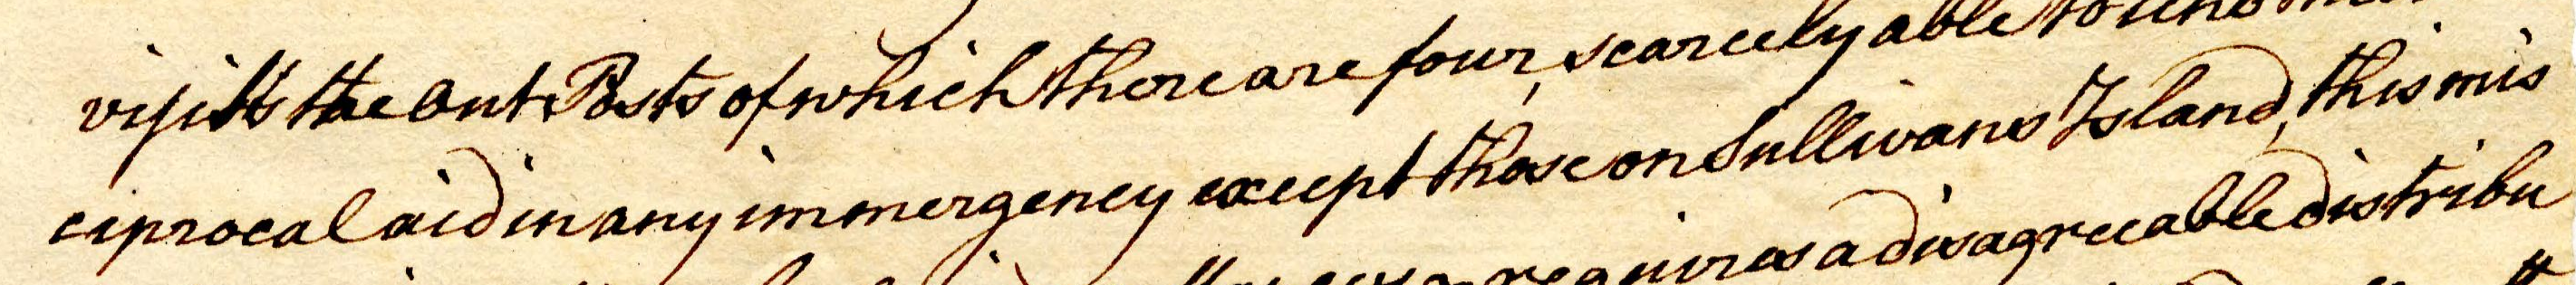ciprocal aid in any immergency except those on Sullivans Island, this mis
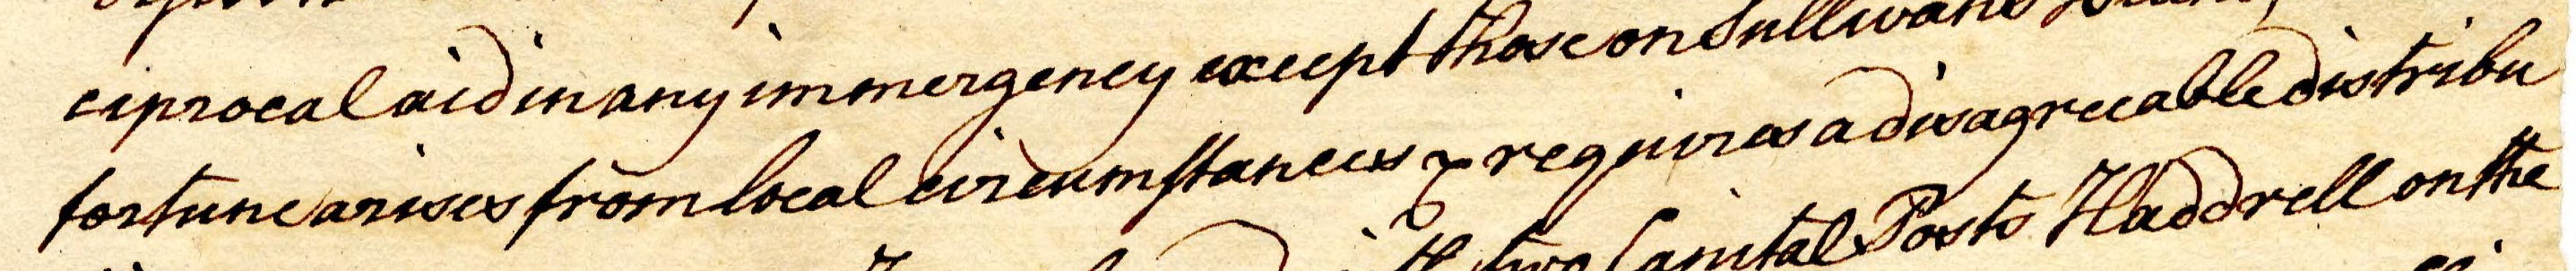fortune arises from local circumstances & requires a disagreeable distribu
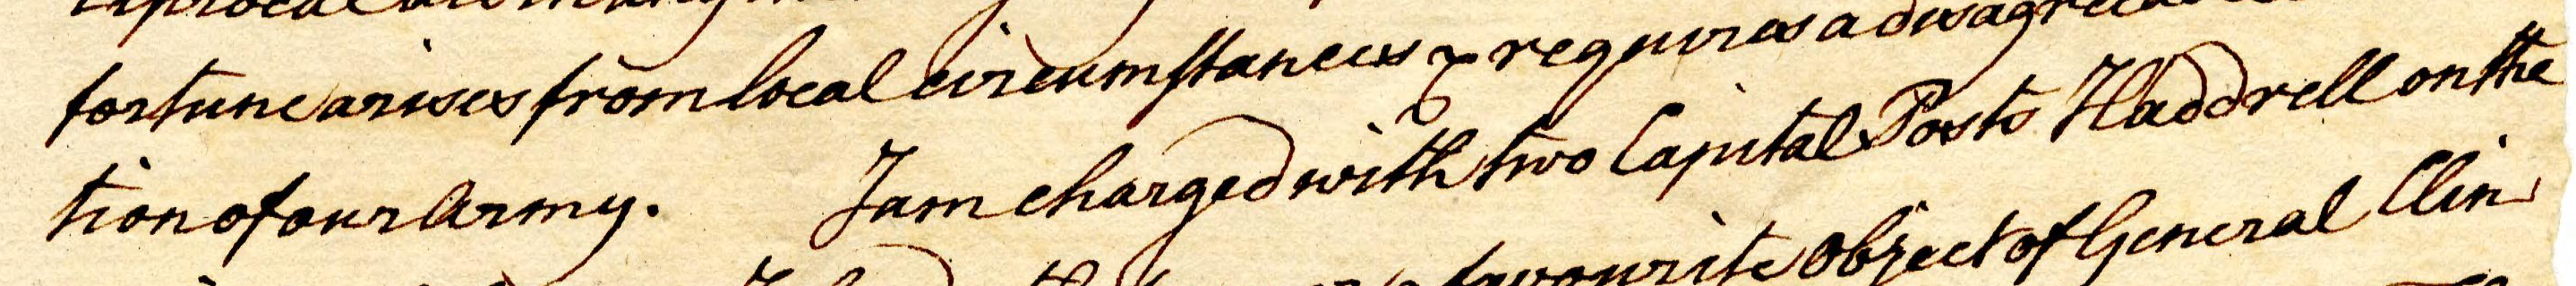tion ofour army. I am charged with two Capital Posts Haddrell on the
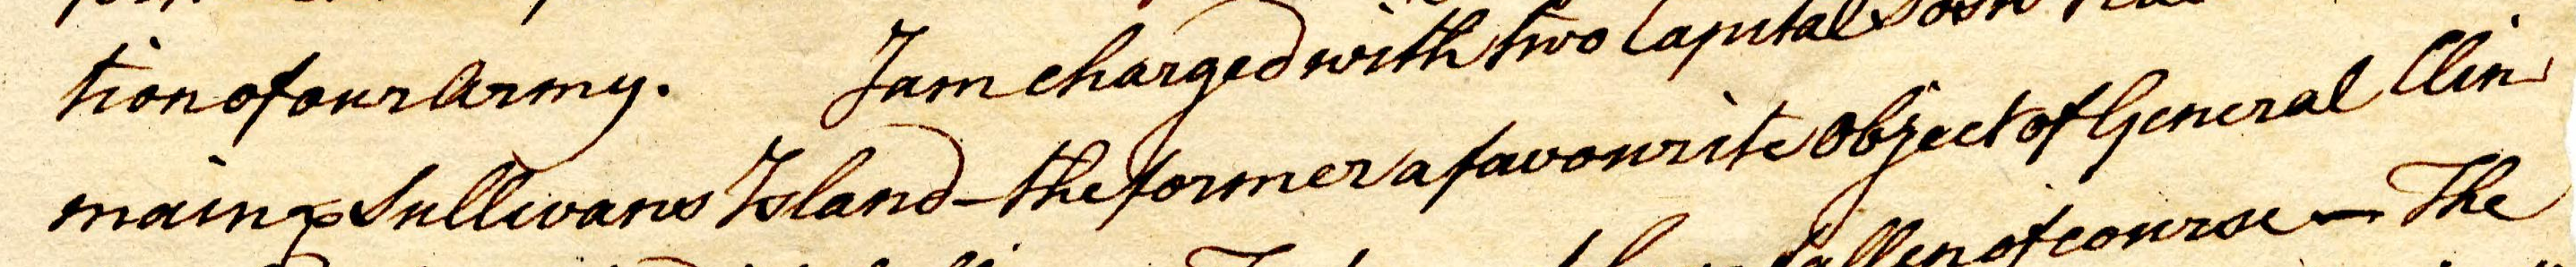main & Sullivans Island- the former a favourite object of General Clin-
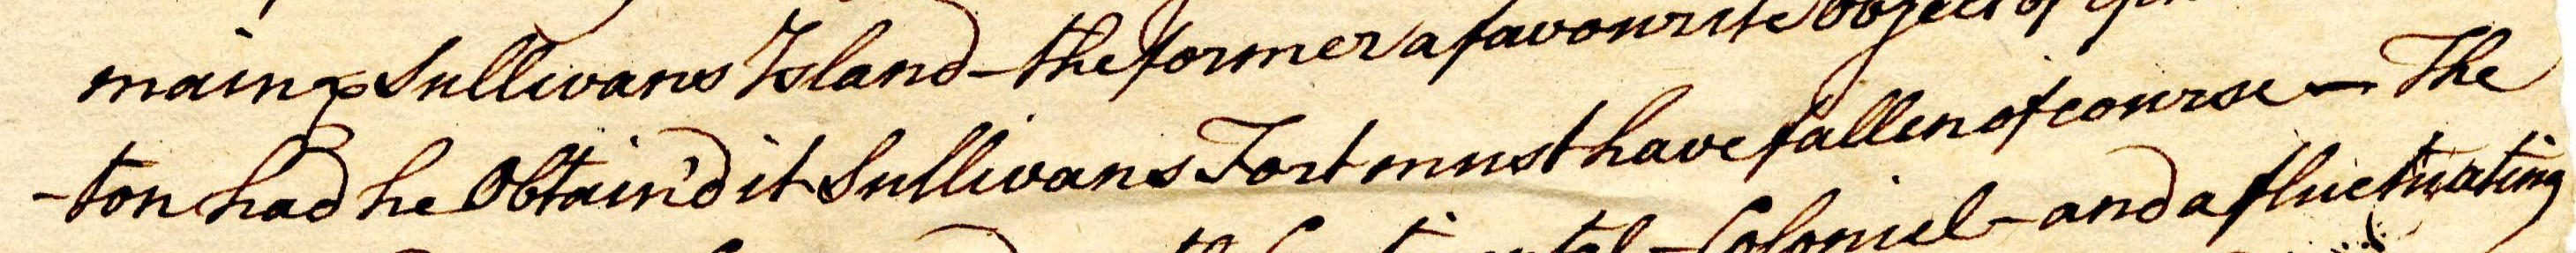-ton had he Obtain'd it Sullivans Fort must have fallen of course- The
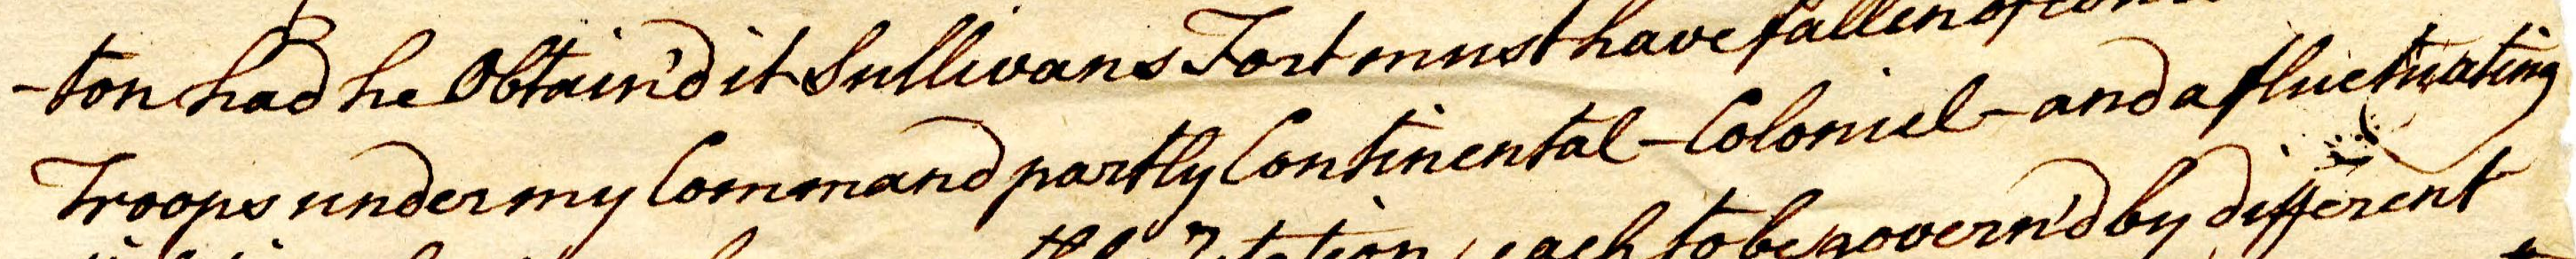Troops under my Command partly Continental- Coloniel and a fluctuating
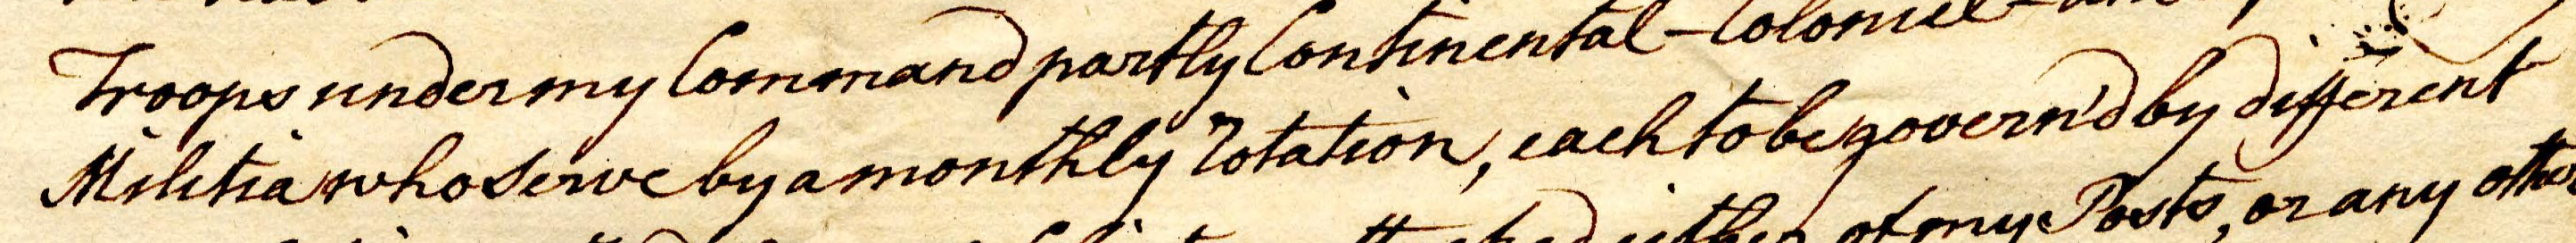Militia who serve by a monthly rotation, each to be govern'd by different
